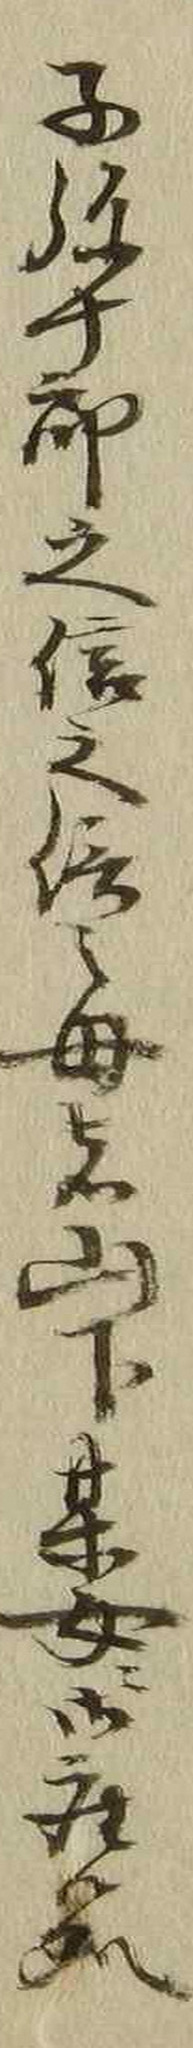子弥十郎之信之信之母者山下某女ニ御座候処
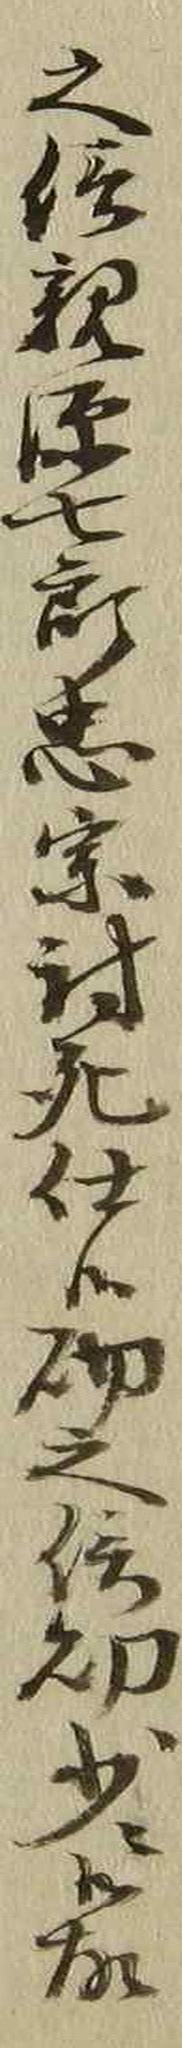之信親源七郎忠宗討死仕候砌之信幼少ニ候故
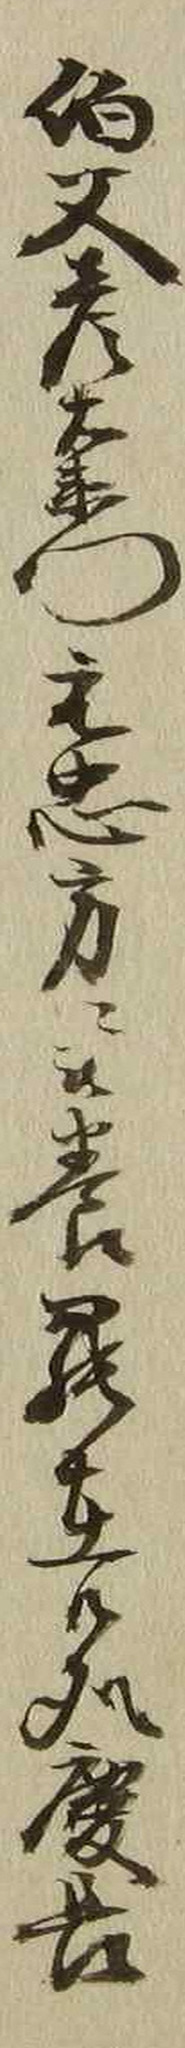伯父彦右衛門元忠方ニ被養罷在候処慶長
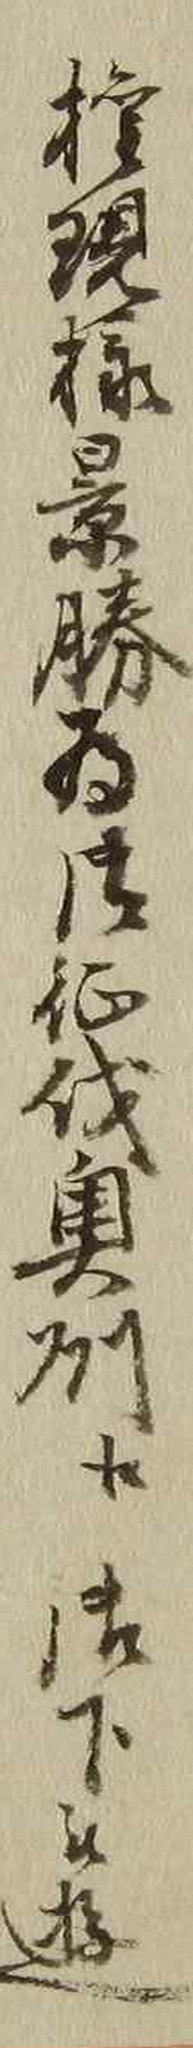権現様景勝為御征伐奥州江御下被遊
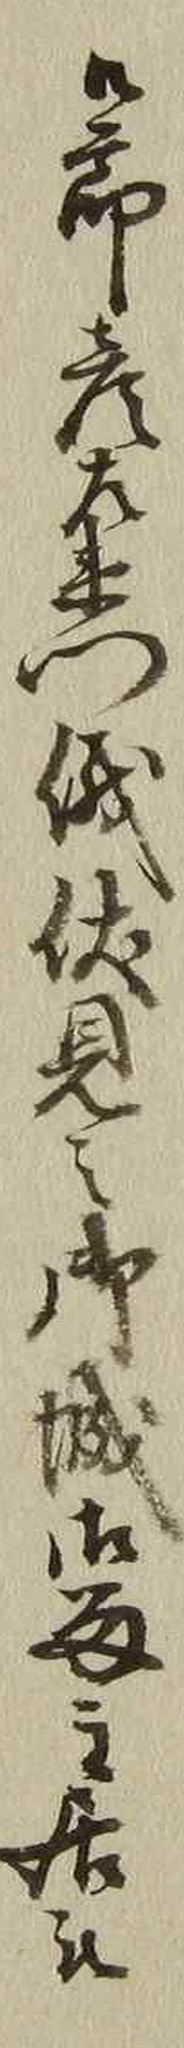候節彦左衛門儀伏見之御城御留主居被
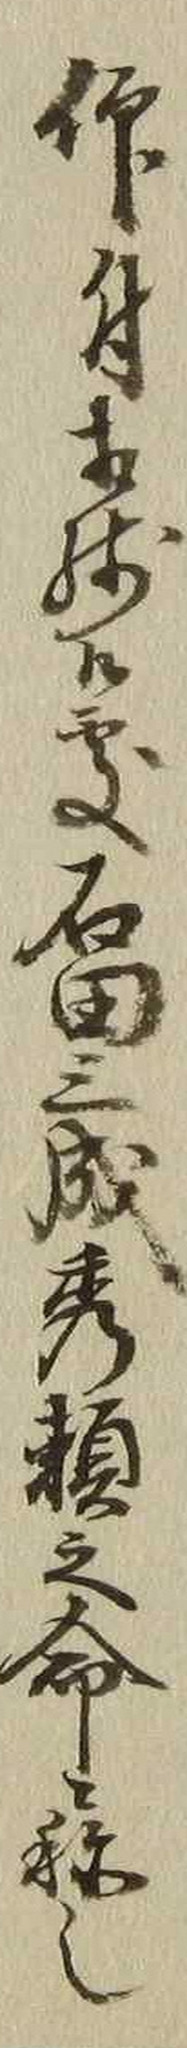仰付相残候處石田三成秀頼之命と称し
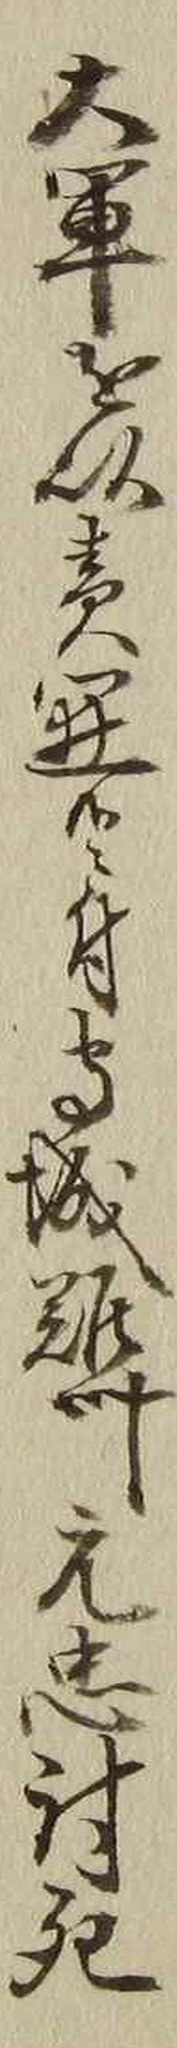大軍を以責開候ニ付守城難叶元忠討死
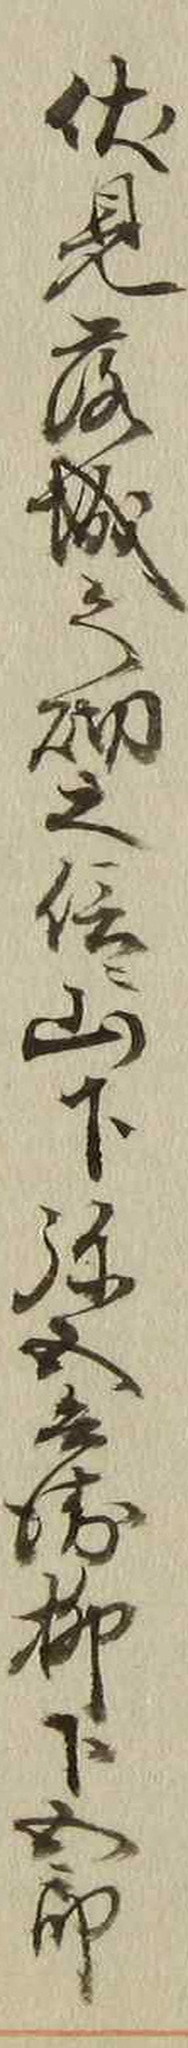伏見落城之砌之信ニ山下弥五兵衛柳下五郎
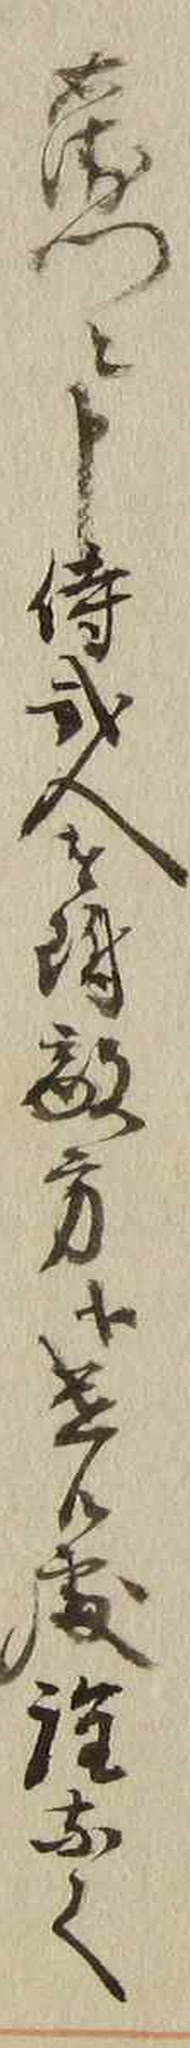右衛門と申侍弐人を附敵方江遣候處程なく
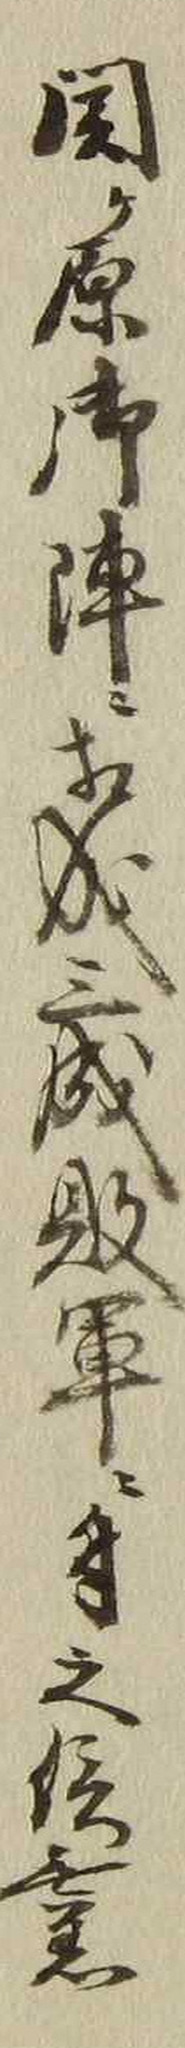関ヶ原御陣ニ相成三成敗軍ニ付之信無恙
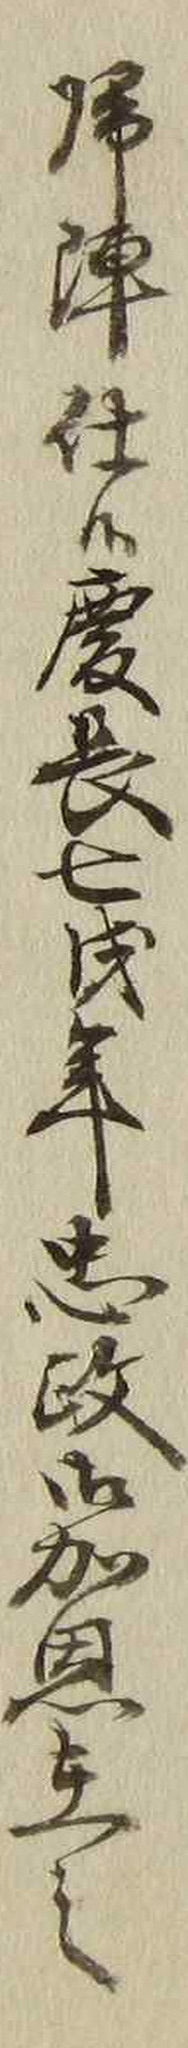帰陣仕候慶長七戌年忠政御加恩在之
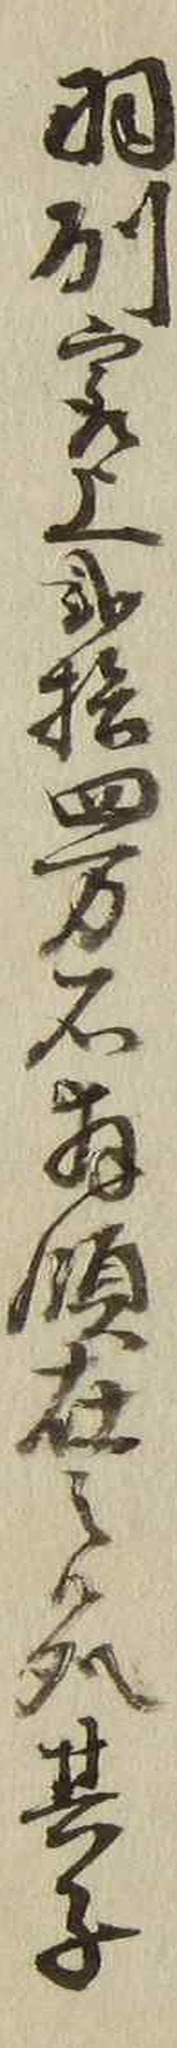羽州最上弐拾四万石拝領在之候処其子
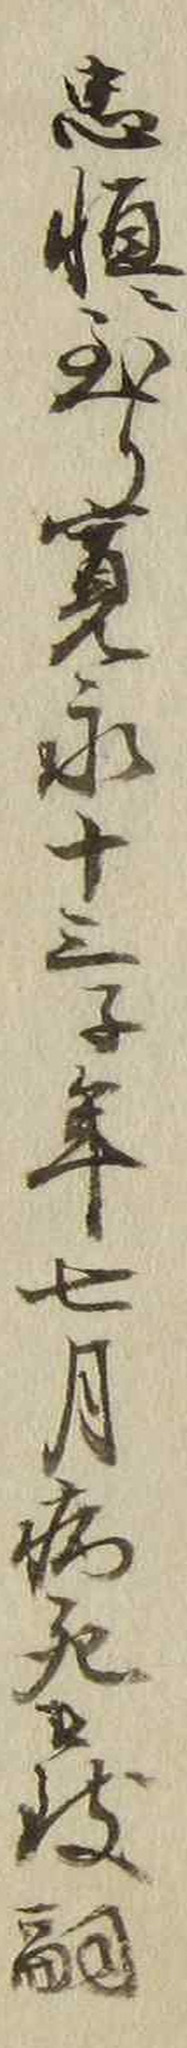忠恒ニ至り寛永十三子年七月病死被致嗣

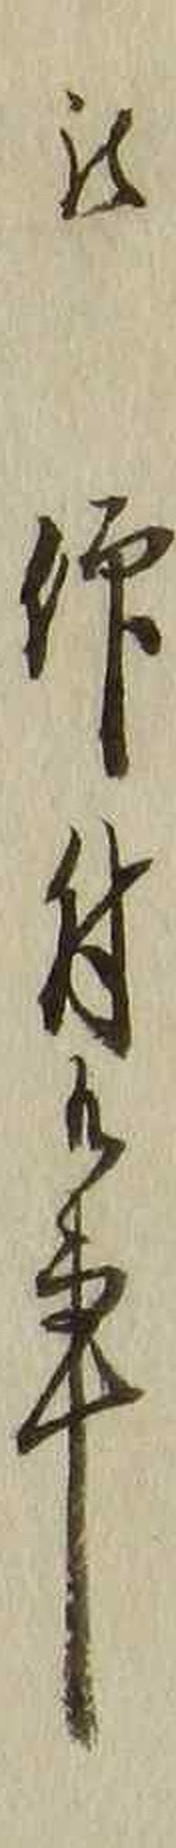被仰付候事
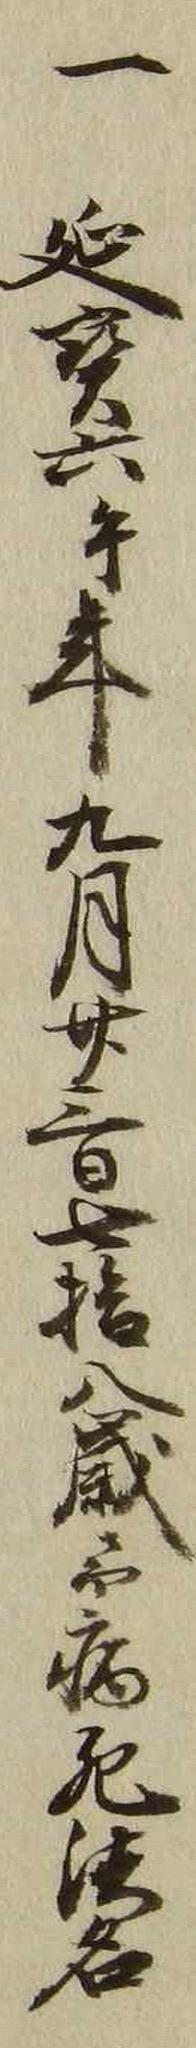一延宝六午年九月廿三日七拾八歳ニ而病死法名
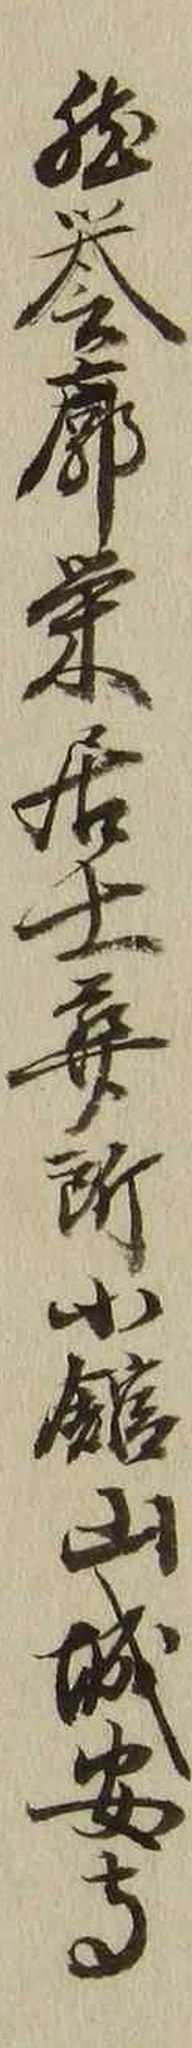全誉廓栄居士葬所小舘山城安寺
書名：諸士系譜　巻之64　と之部7
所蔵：会津若松市立会津図書館
